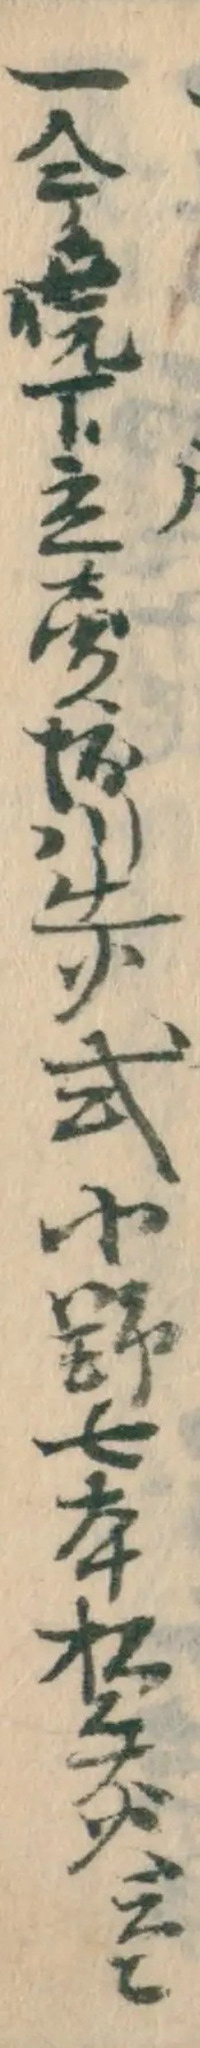一今暁下立売堀川出火或北野七本松失火云々

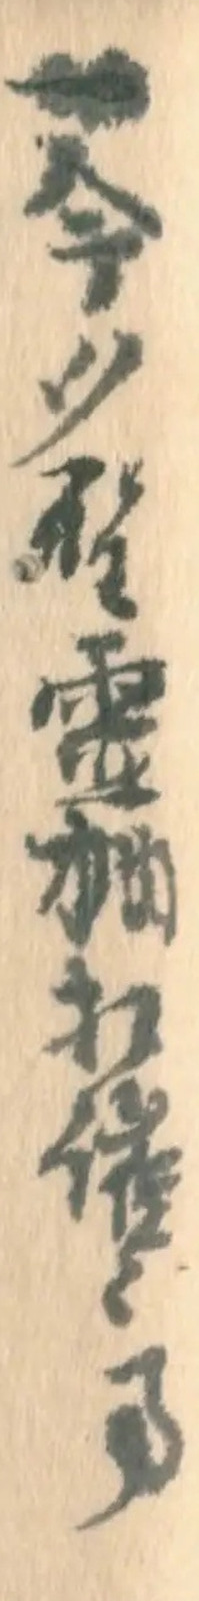一今夕聖霊棚相催候事
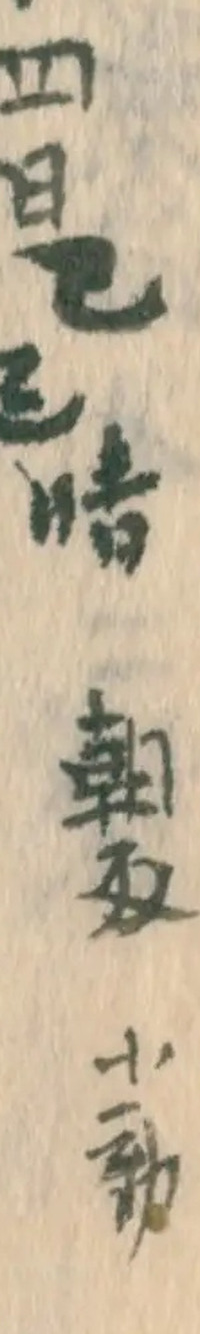十四日己巳晴朝雨小動
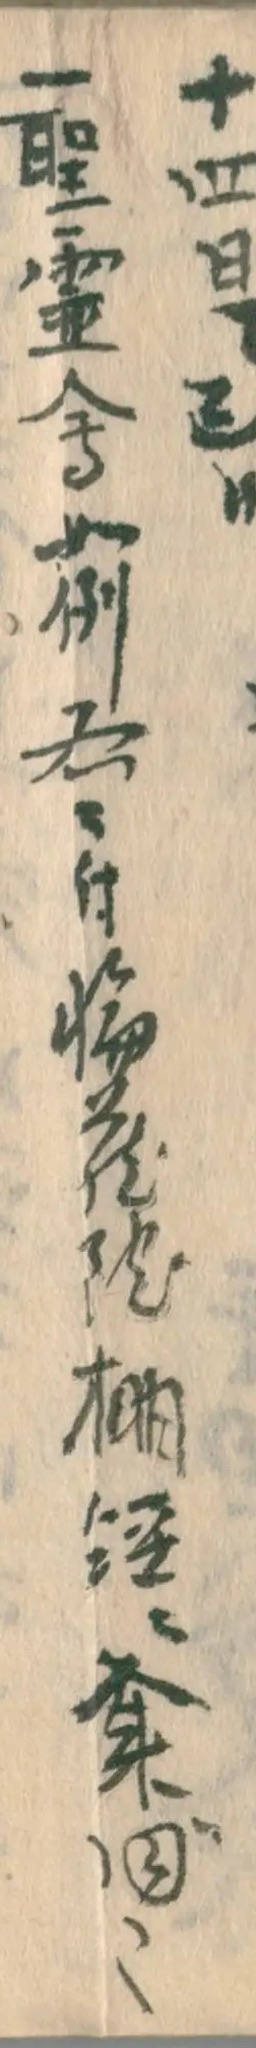一聖霊会如例右ニ付輪蔵院棚経ニ入来ぼた
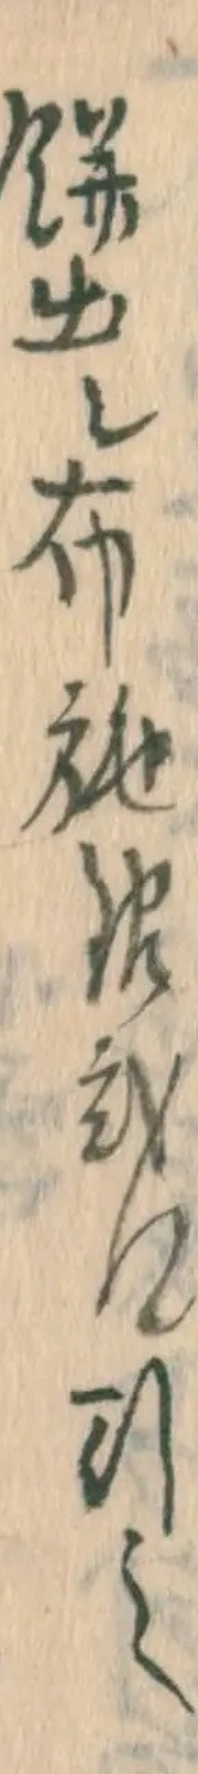餠出シ布施銀弐匁引之
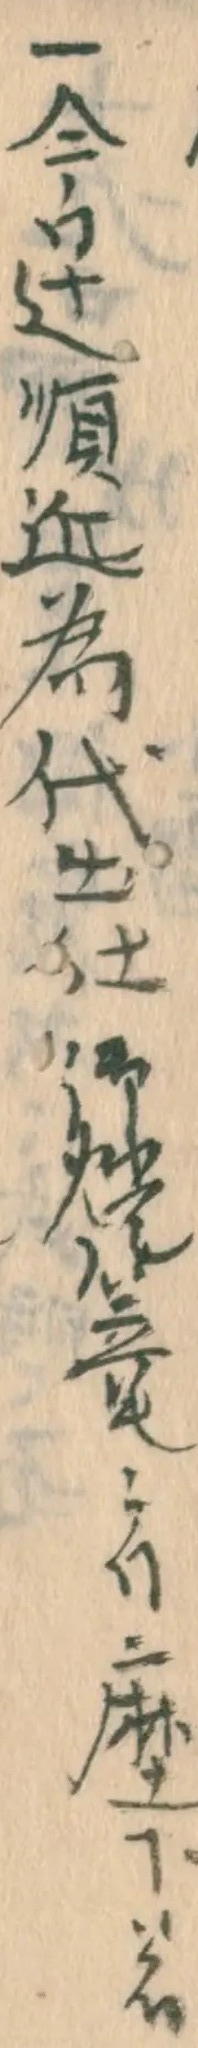一今日辻順近為代出仕御燈籠ニ付麻上下着
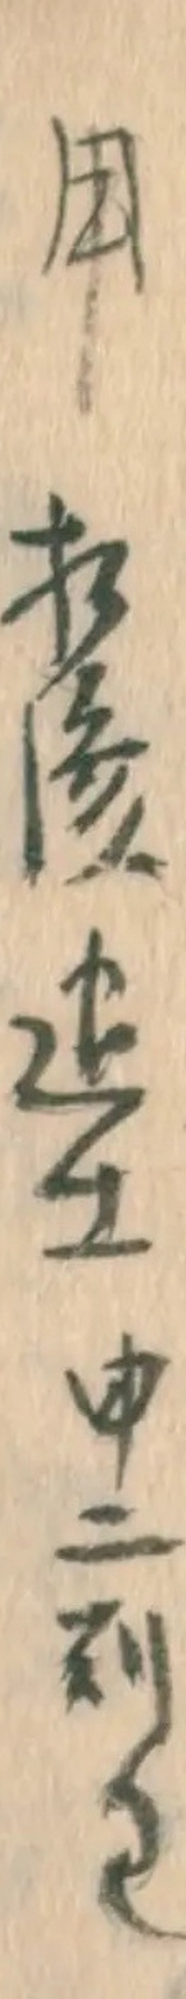用相済退出申二刻也
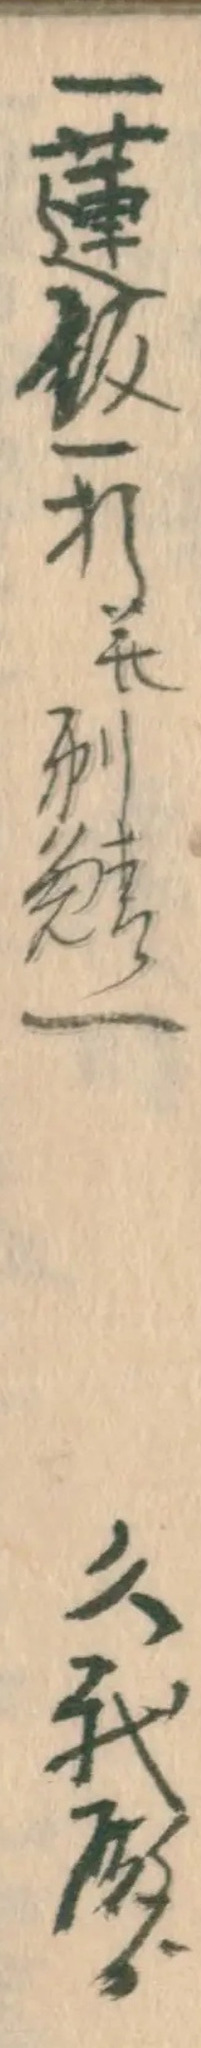一蓮飯一折并刺鯖一久我殿ゟ
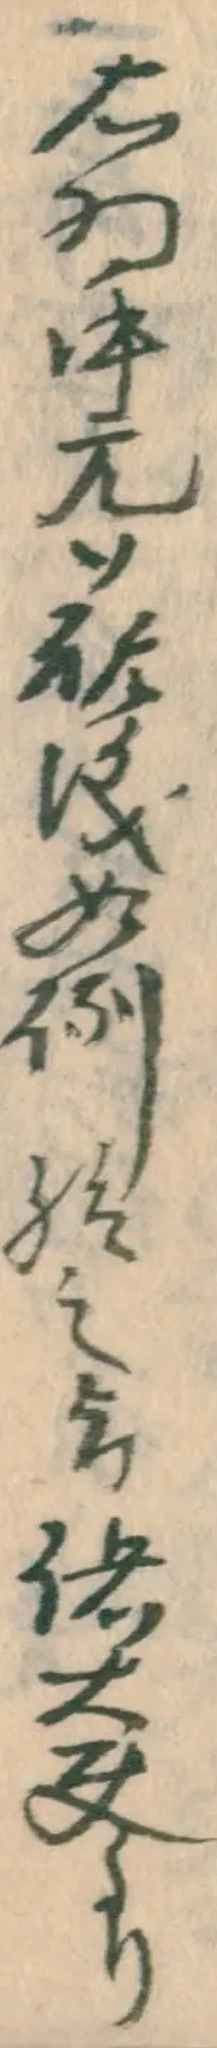右為中元御祝儀如例給之旨諸大夫より
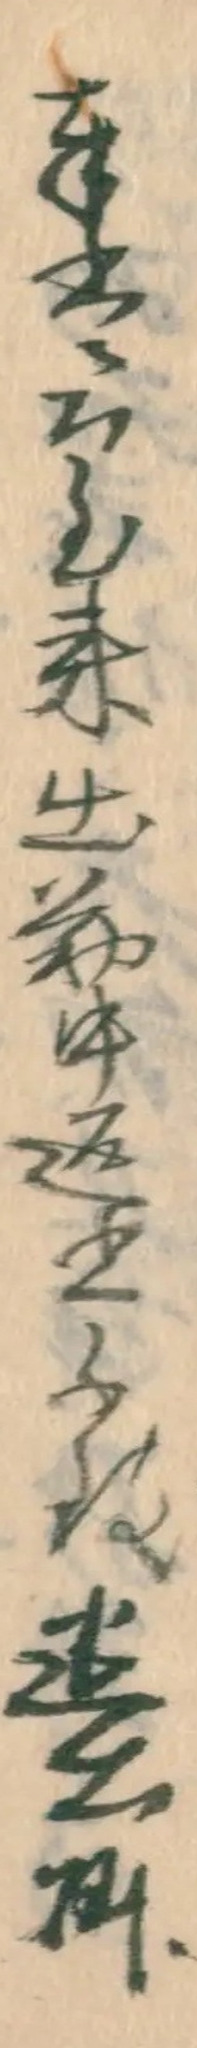奉書ニ而到来出勤中返書不致退出掛
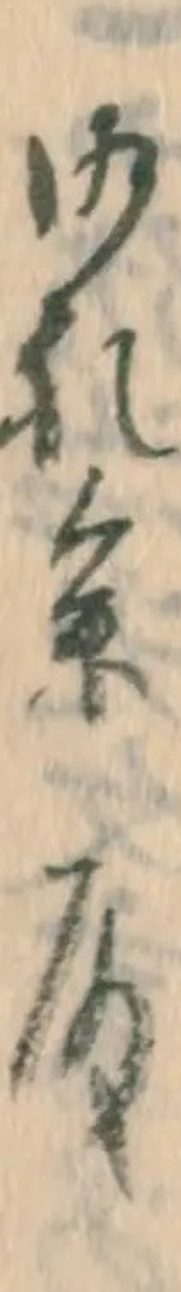御礼参殿
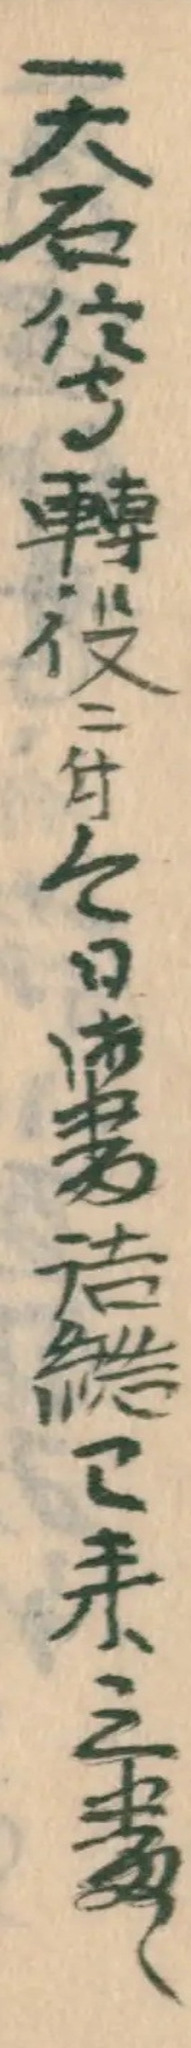一大石信守転役ニ付今日御番詰総已来三番へ
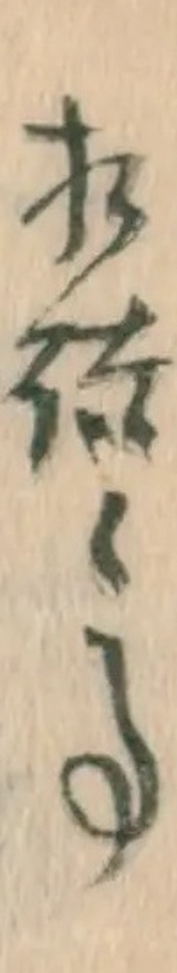相詰候事
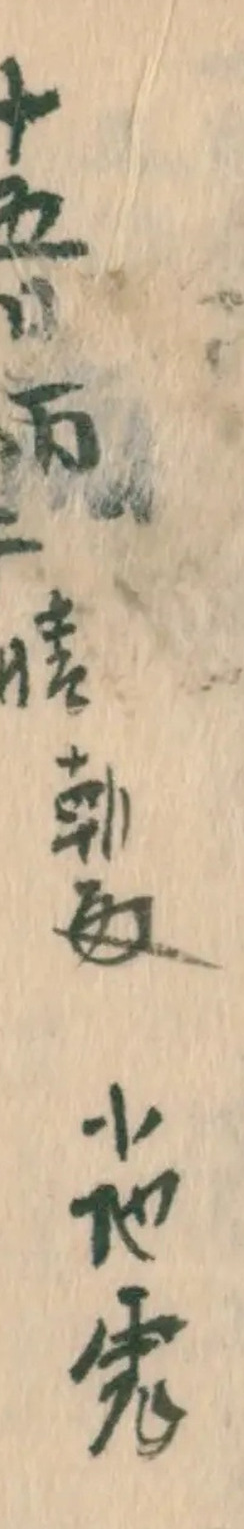十五日丙午晴朝雨小地震
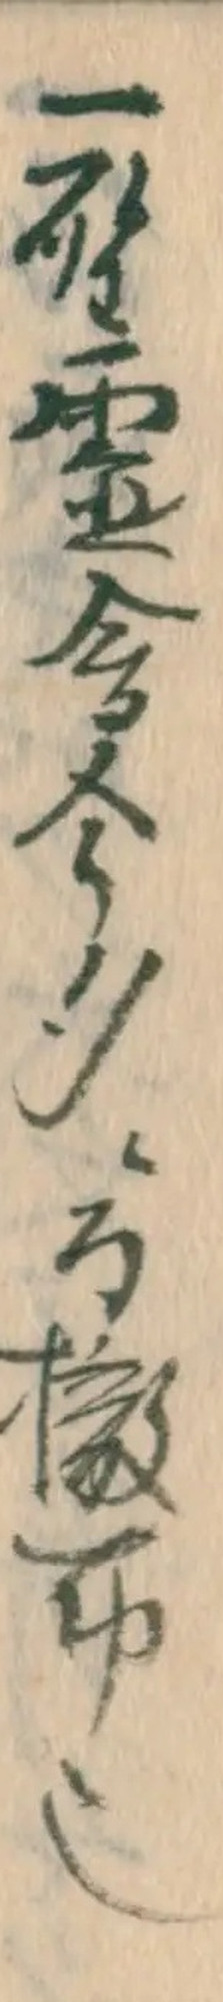一聖霊会今夕ニ而撤却也
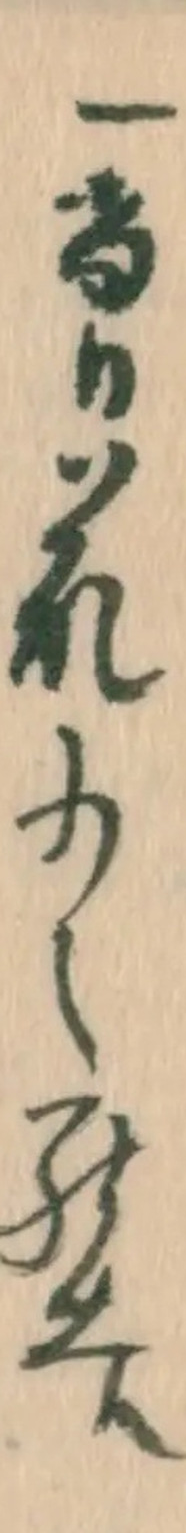一当日御礼少々罷出ル
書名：禁裏御所御用日記. [131]
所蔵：国立国会図書館 National Diet Library, JAPAN
